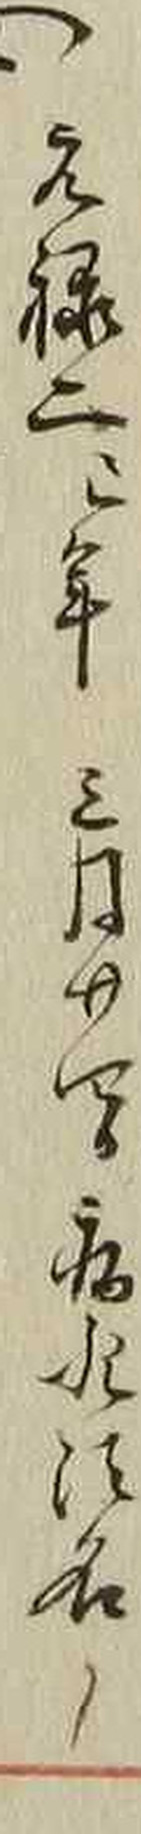元禄二巳年三月廿四日病死法名
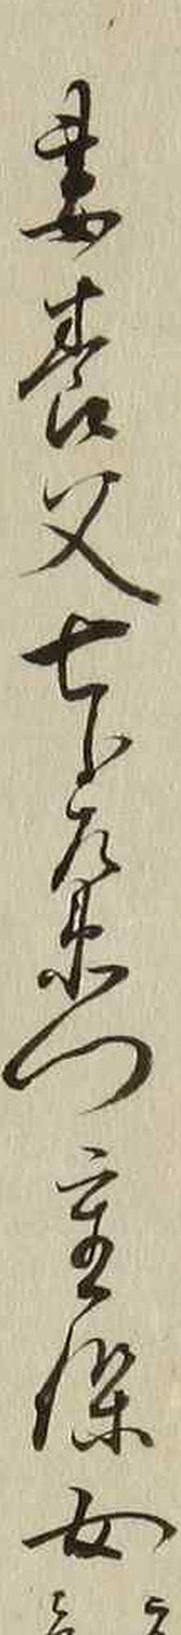妻養父七郎左衛門重保女
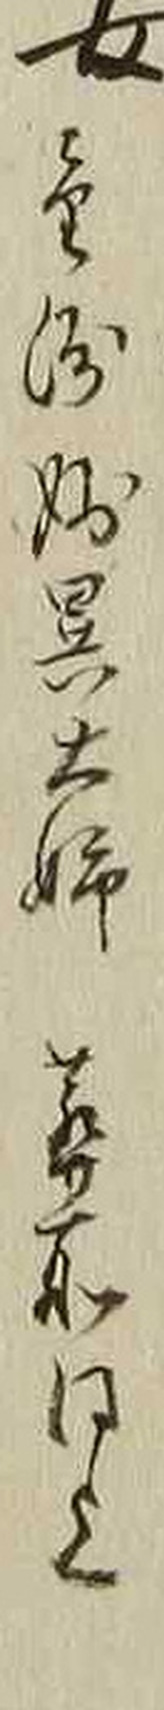童洲妙異大姉葬所同上
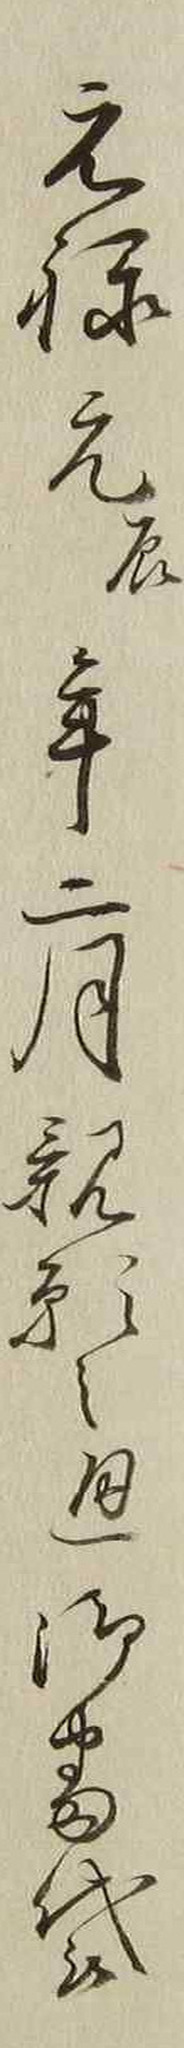一元禄元辰年二月親願い之通御番代
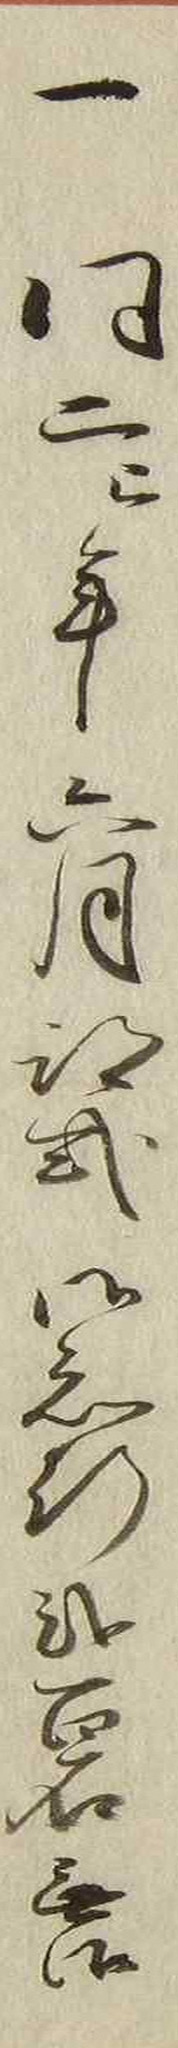一同二巳年六月跡式御知行弐百石御

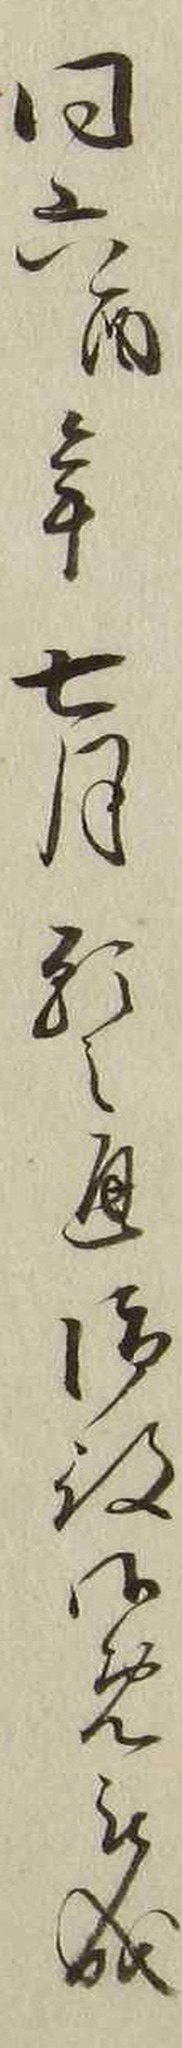一同六酉年七月願い之通り御役御免成
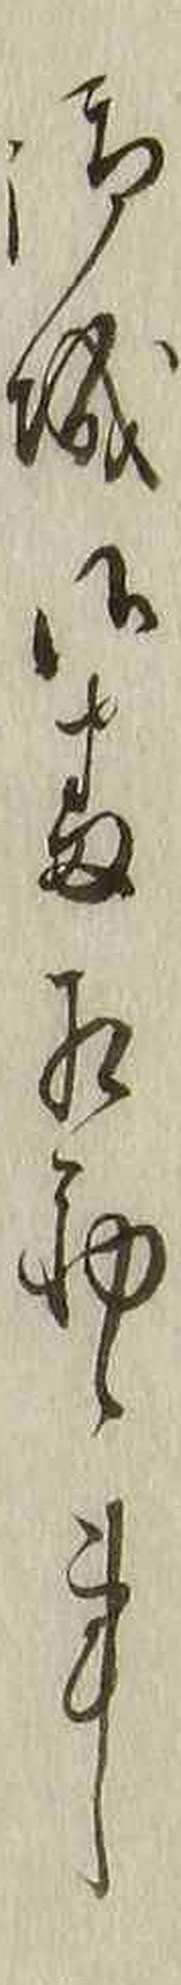御城御番相勤め候事
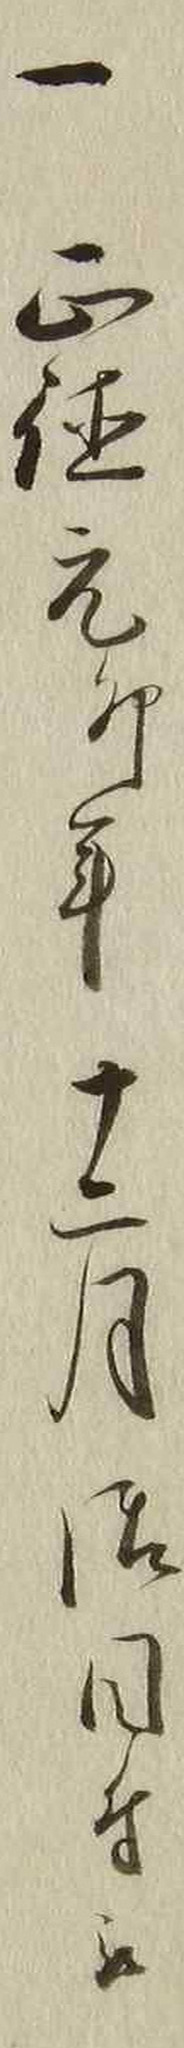一正徳元卯年十二月御目付
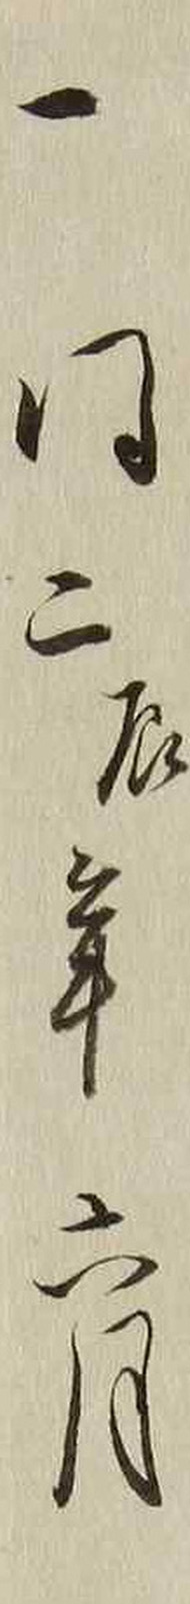一同二辰年六月
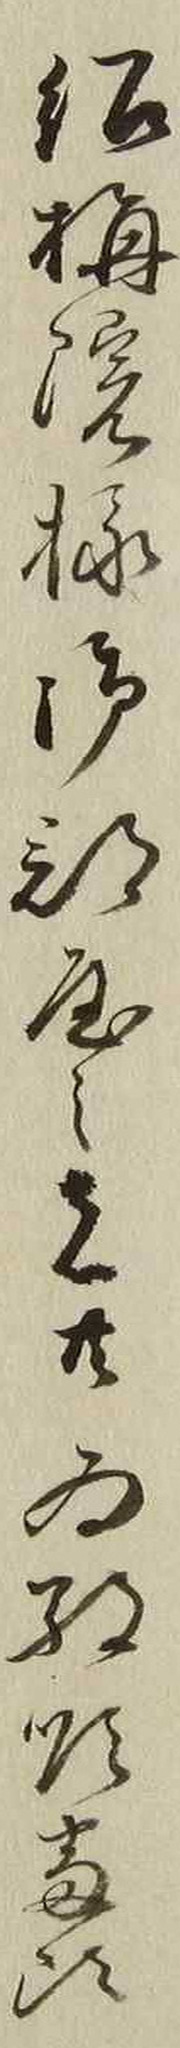紹栴院様御部屋之者共敬たる順番次
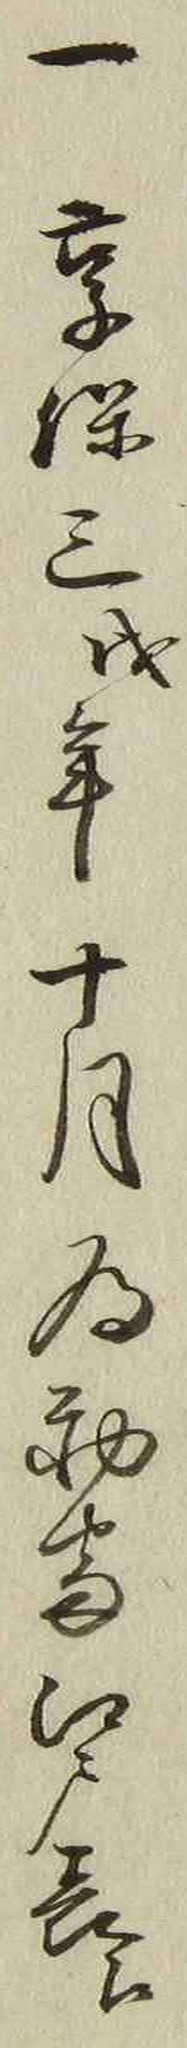一享保三戌年十月勤番之為江戸表へ
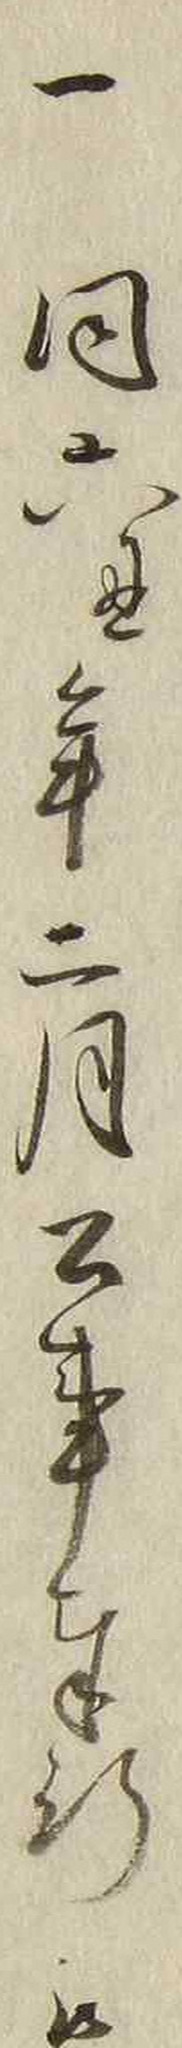一同六丑年二月公事奉行

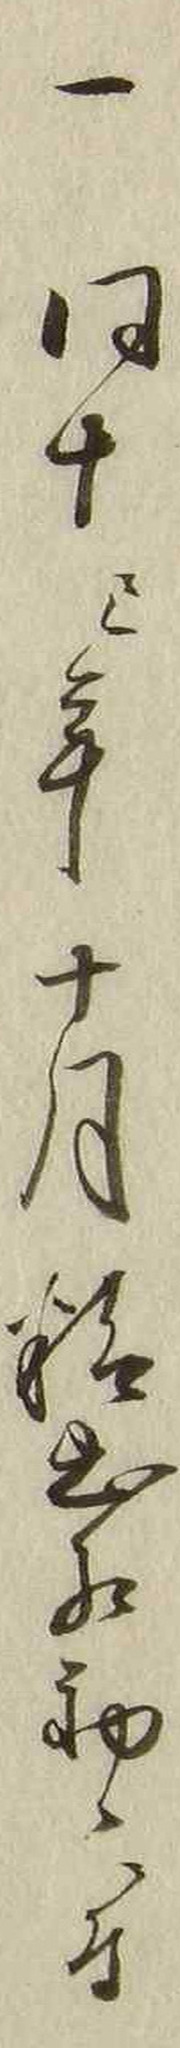一同十巳年十月精出し相勤め候ニ付き
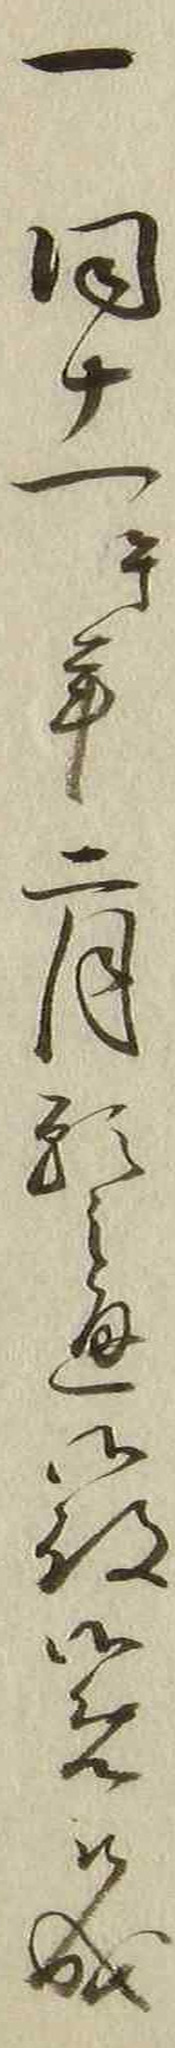一同十一午年二月願い之通り御役御免成られ
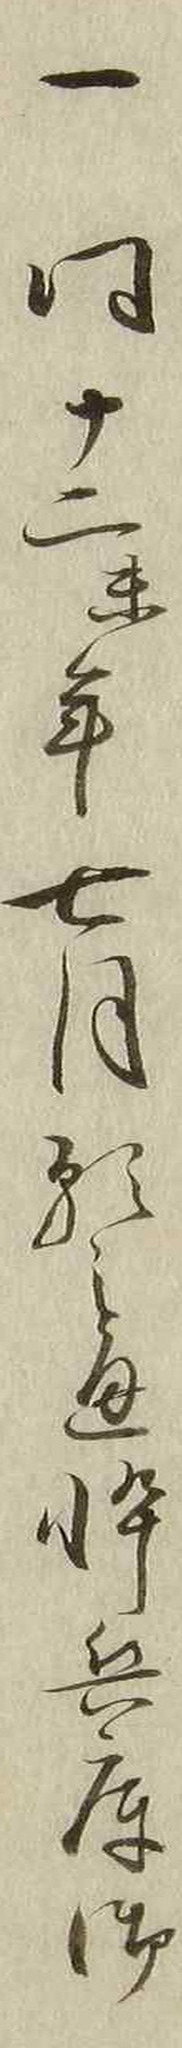一同十二未年七月願い之通り倅兵庫御
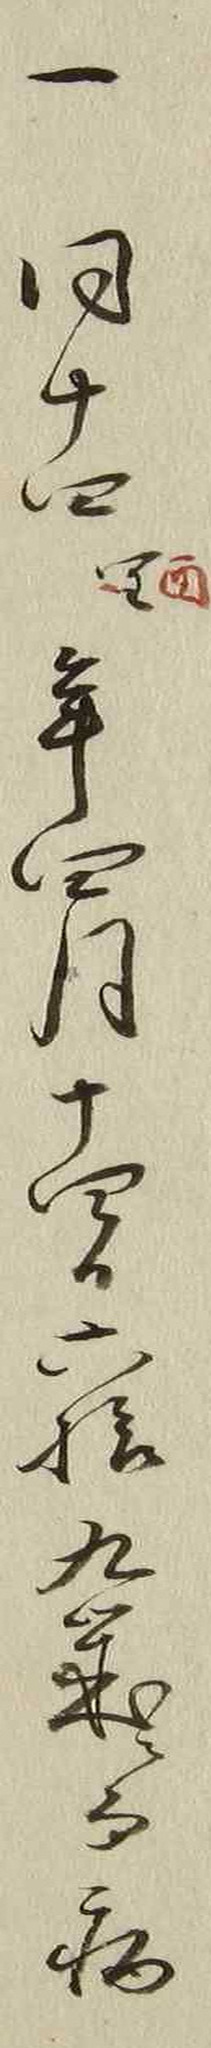一同十四酉年四月十四日六拾九歳ニて病
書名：諸士系譜　巻之20　い之部20
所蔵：会津若松市立会津図書館
